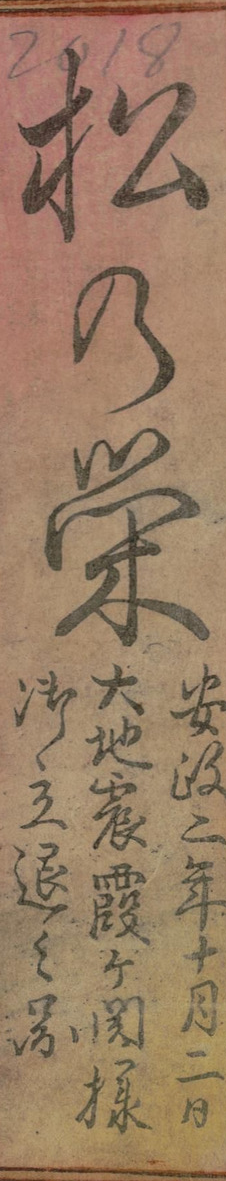松の栄大地震霞ヶ関様
